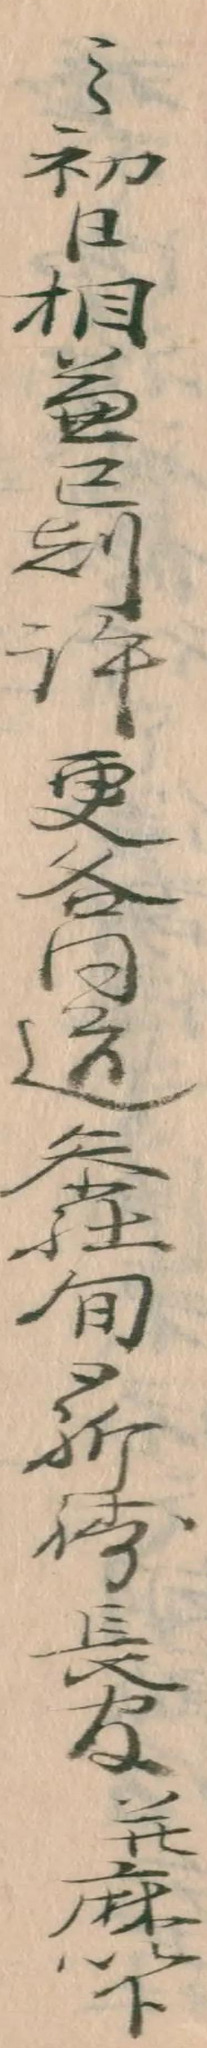之初日相兼巳刻許更各同道参社旬御祈祷長官并麻以下
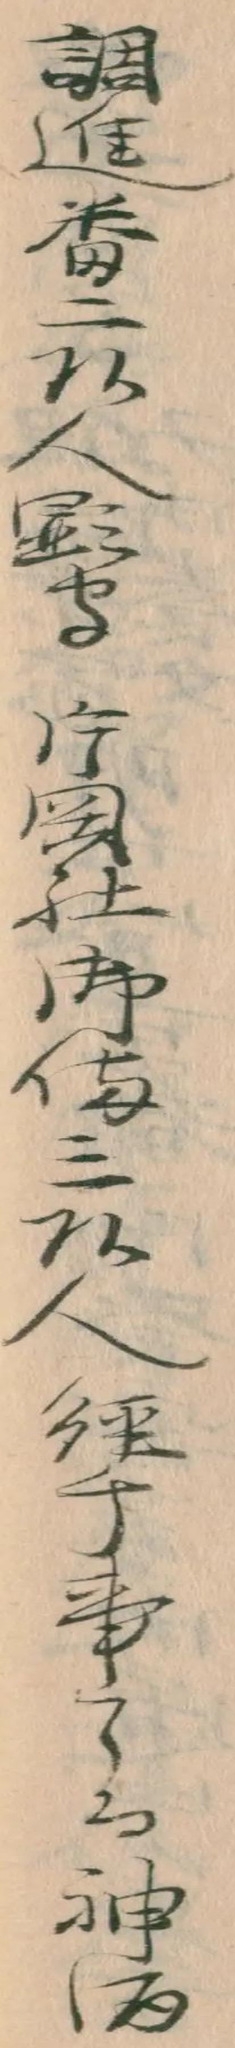調進番二頭人顕守片岡社御備三頭人経千事了而神酒
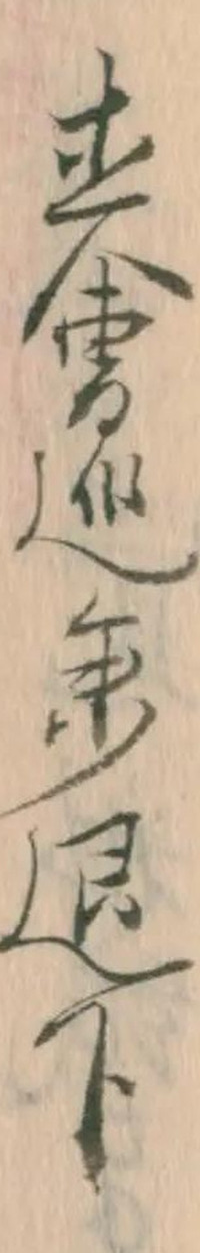直會巡参退下
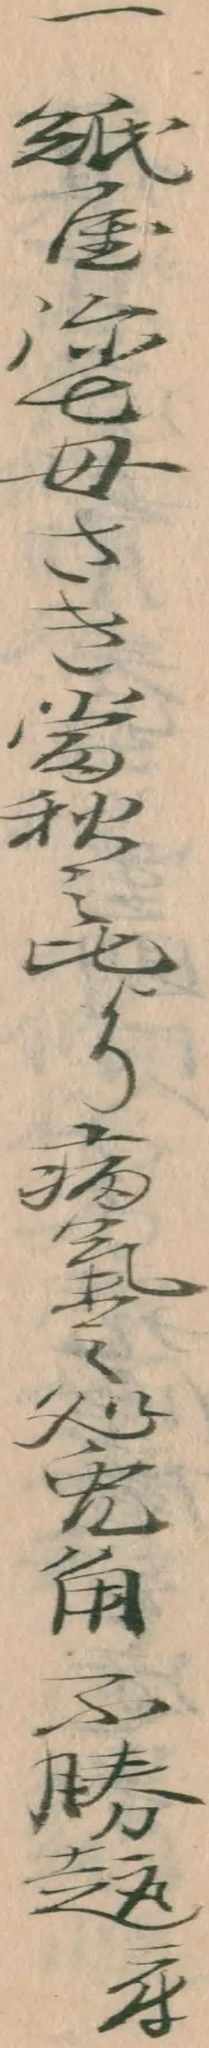一越屋弥七母さき當秋之比より病氣之処兎角不勝趣二付
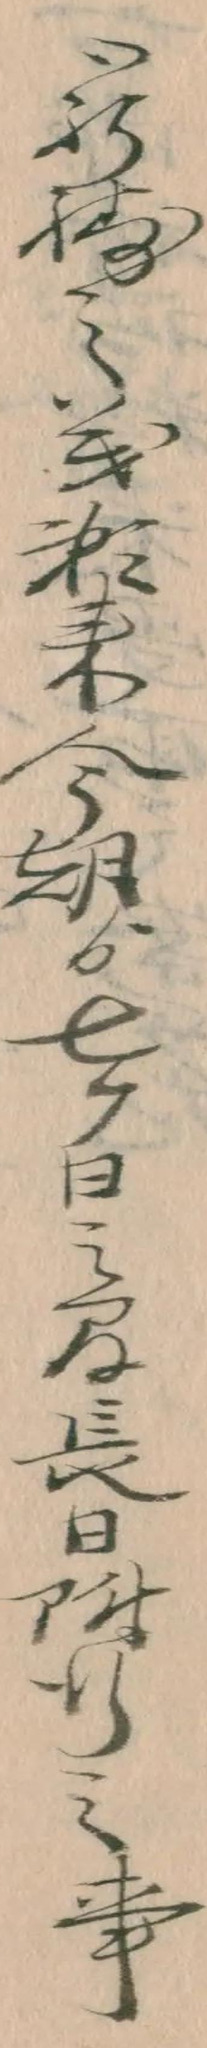御祈祷之義頼来今朝ゟ七ヶ日之間長日附行之事
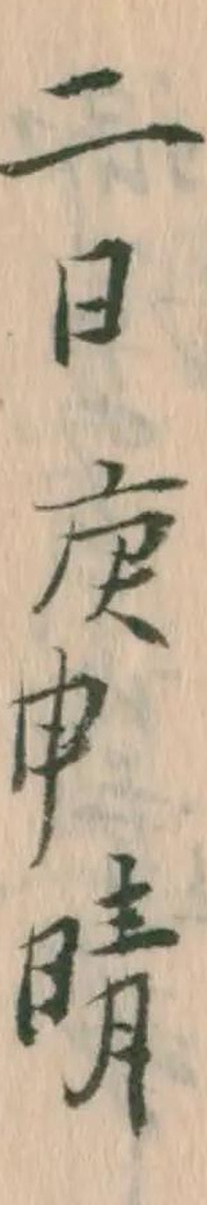二日庚申晴
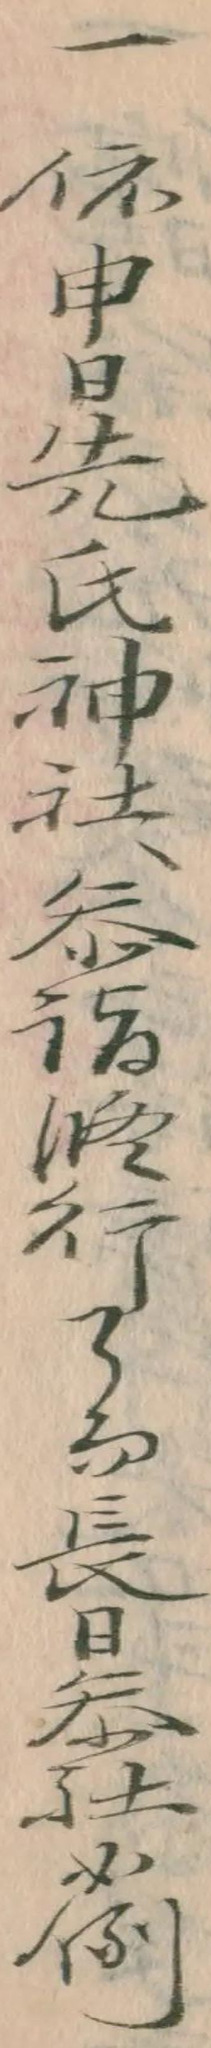一依申日先氏神社へ参詣修行了而長日参社如例
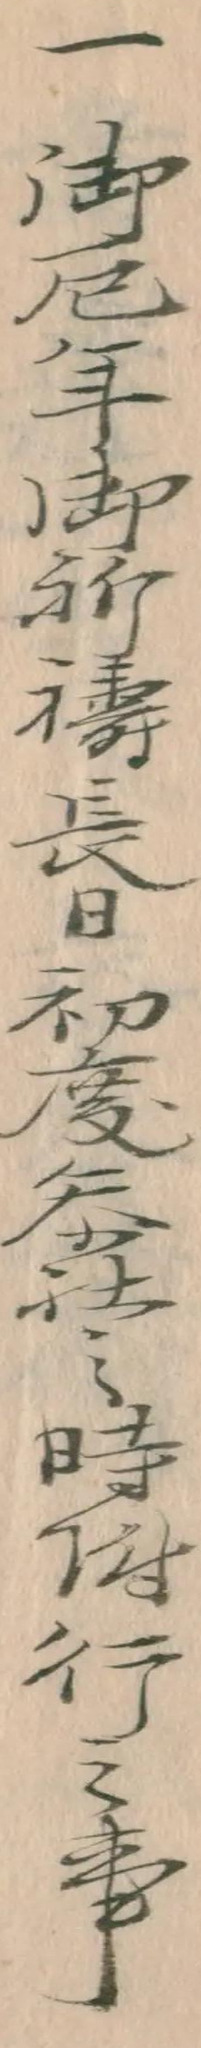一御厄年御祈祷長日初度参社之時附行之事
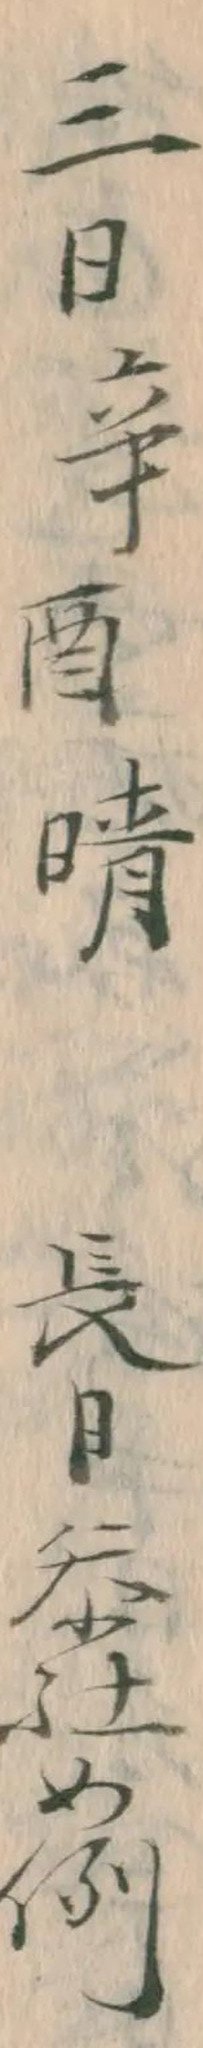三日辛酉晴長日参社如例
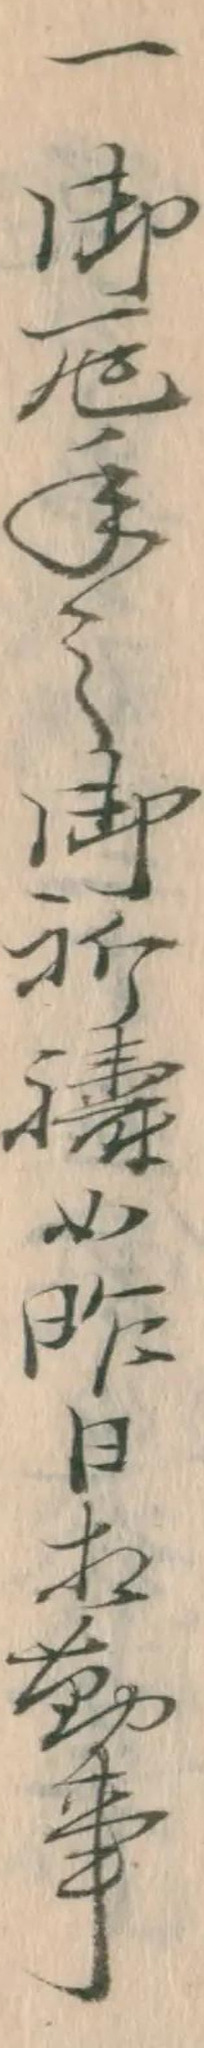一御厄年之御祈祷如昨日相勤事
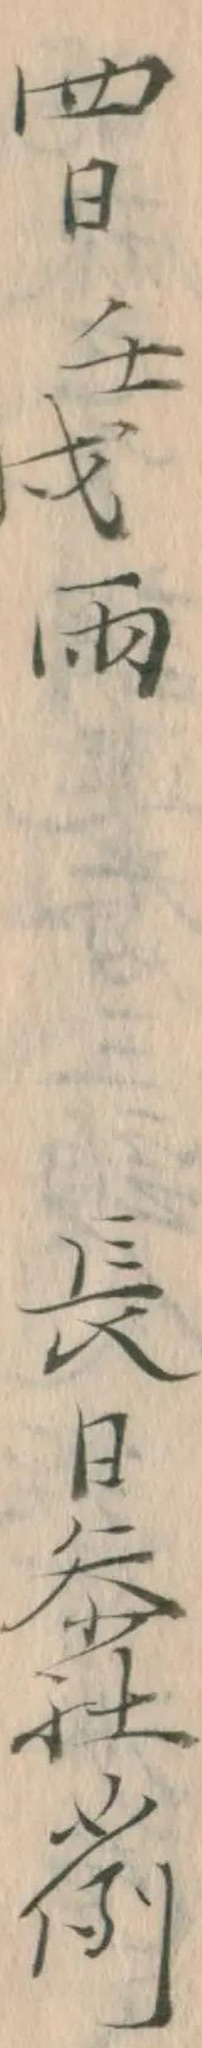四日壬戌雨長日参社如例
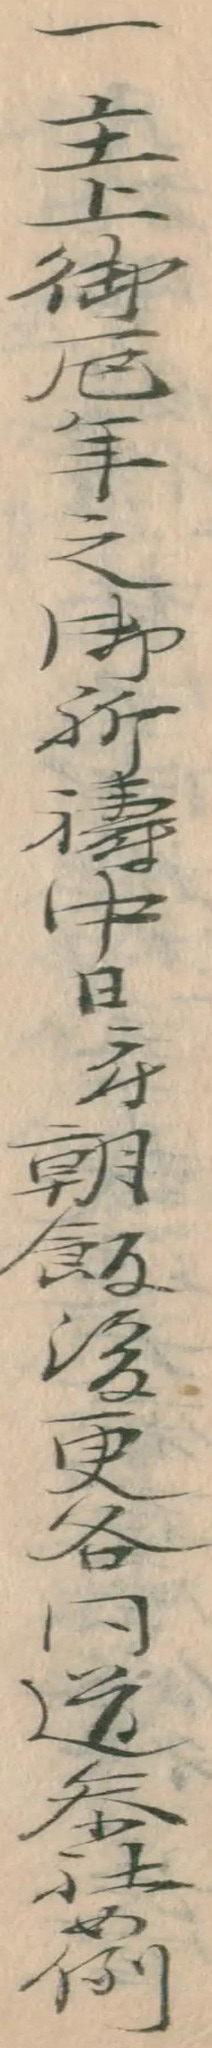一主上御厄年之御祈祷中日ニ付朝飯後更各同道参社如例

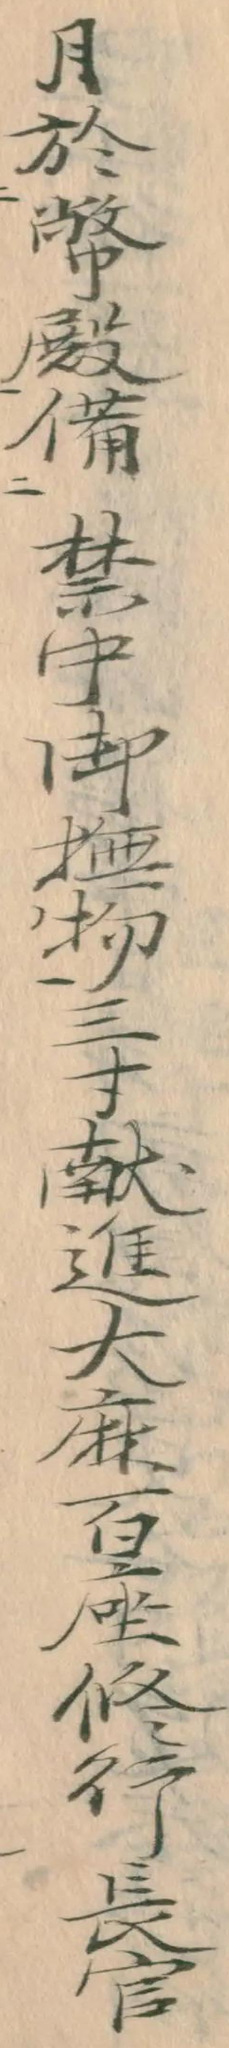月於幣殿備禁中御撫物三寸献進大麻百座修行長官
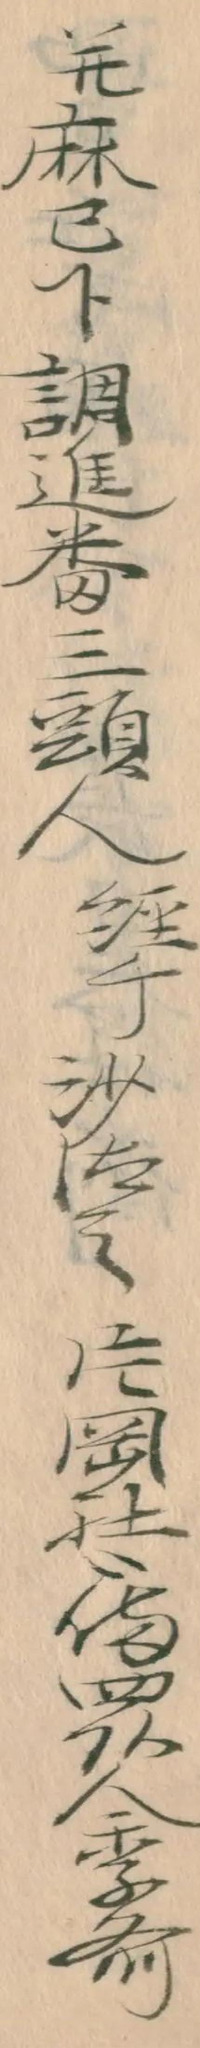并麻已下調進三頭人経千沙汰之片岡社御備四頭人季前
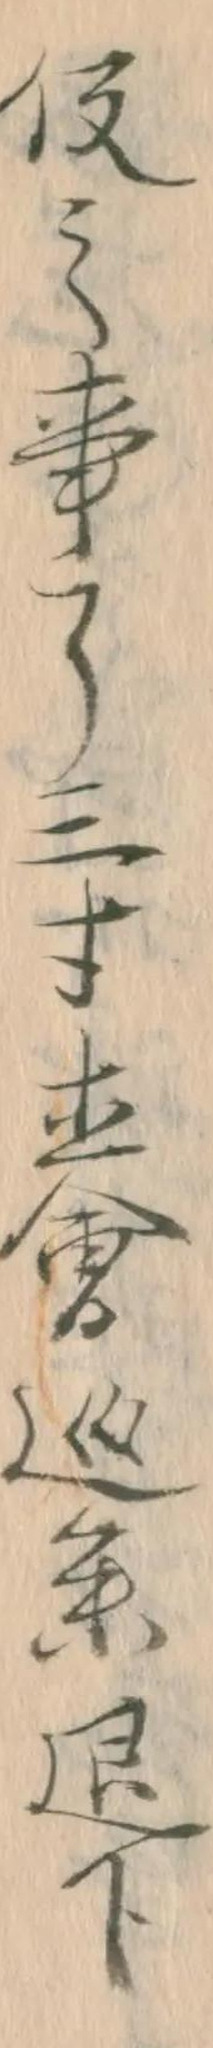役之事了三寸直會巡参退下
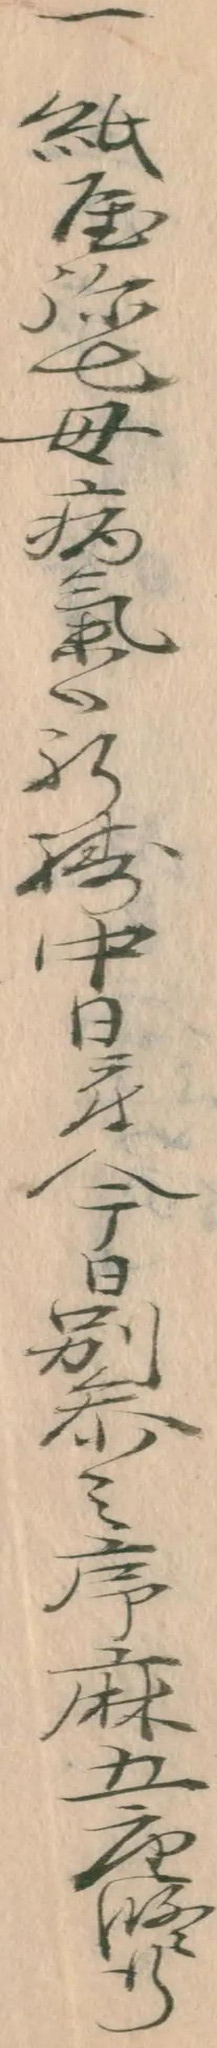一紙屋弥七母病氣御祈祷中日ニ付今日別参之序麻五夜修行
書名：賀茂社記録. 第74冊
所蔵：国立国会図書館 National Diet Library, JAPAN
